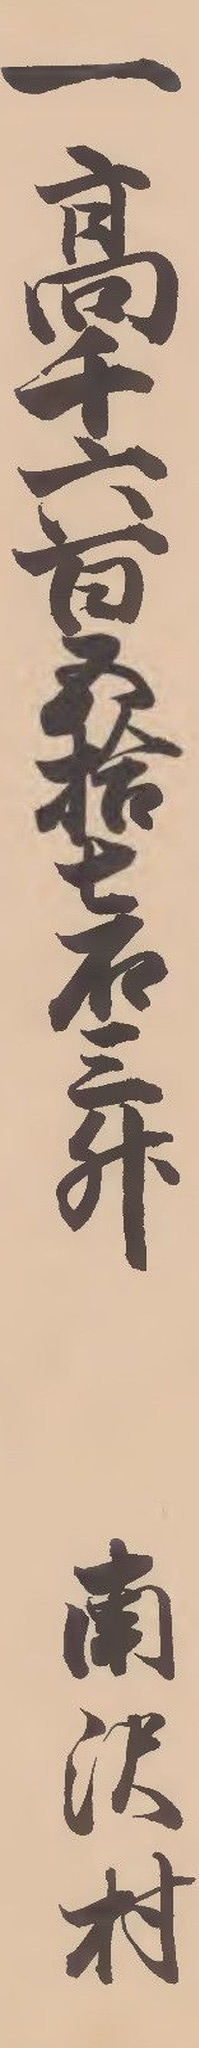一高千六百五拾七石三升南沢村
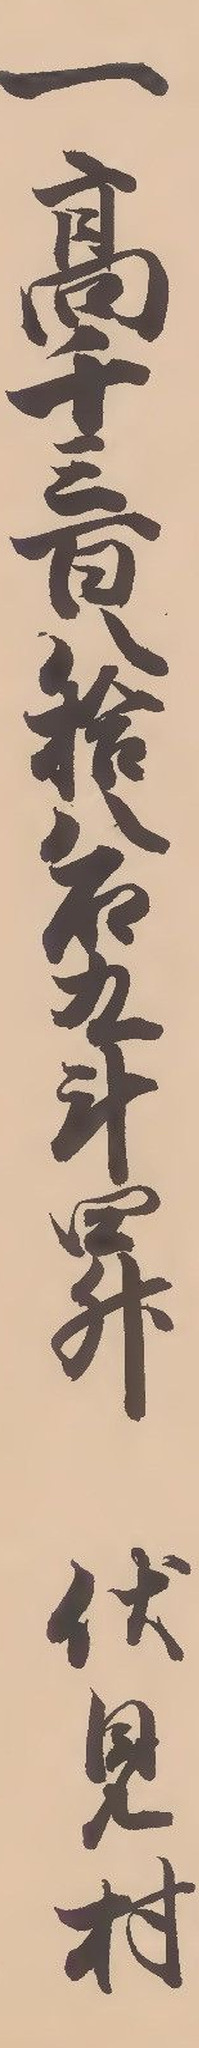一高千三百八拾八石九斗四升伏見村

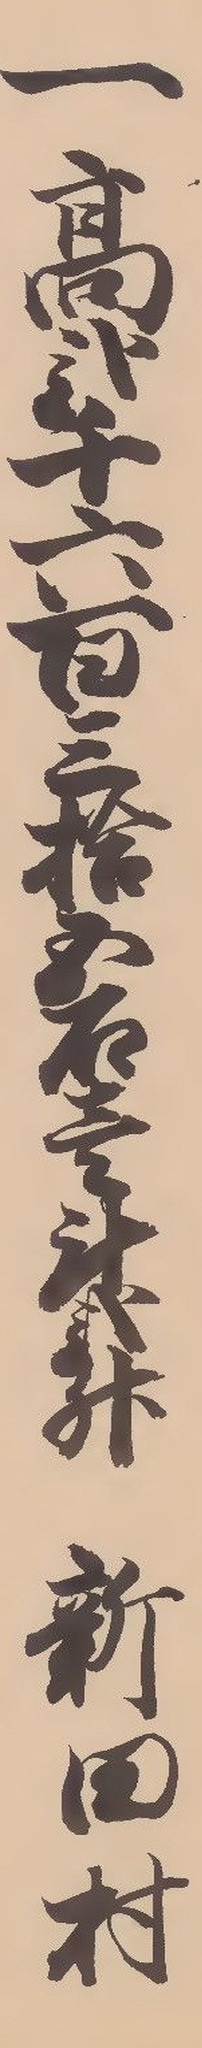一高弐千六百三拾五石壱斗弐升新田村
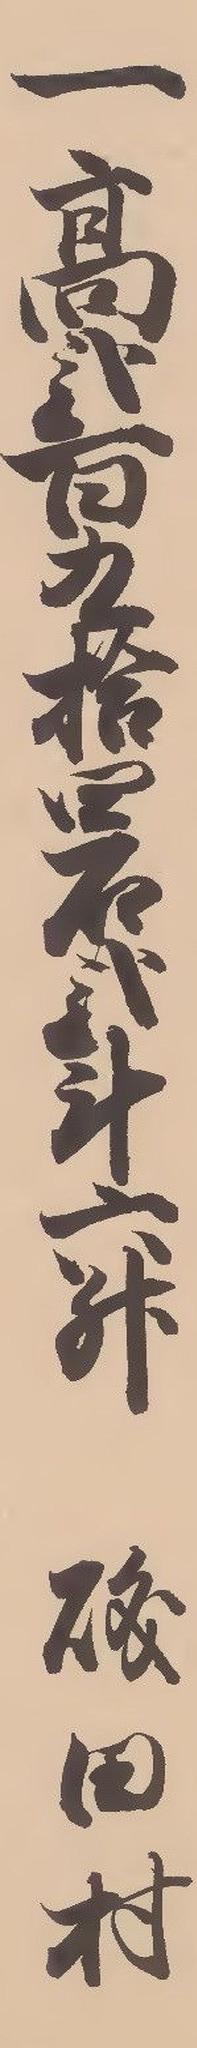一高弐百九拾四石弐斗六升磯田村
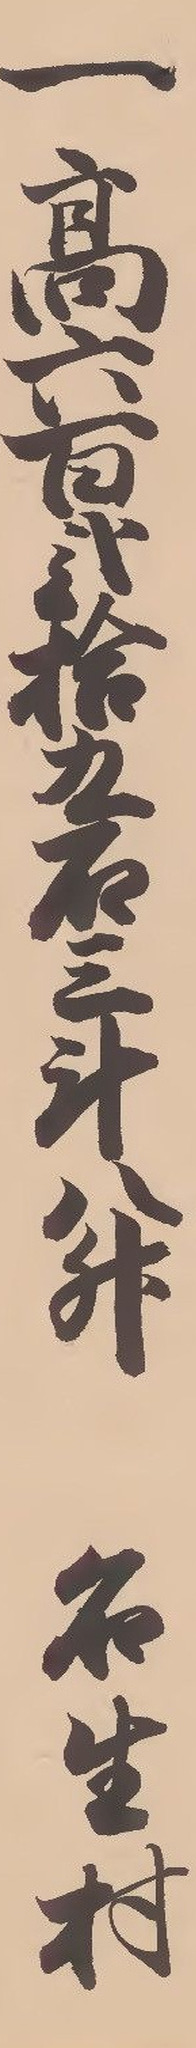一高六百弐拾九石三斗八升名生村
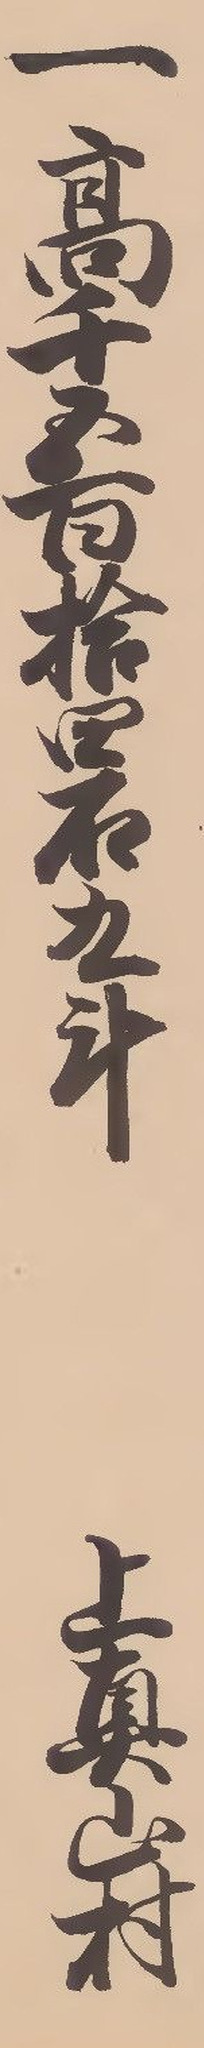一高千五百拾四石九斗上真山村
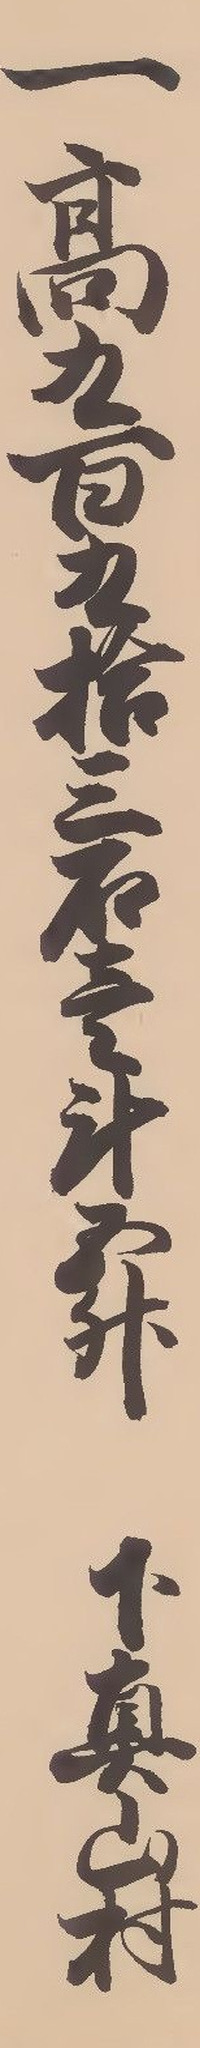一高九百九拾三石壱斗五升下真山村
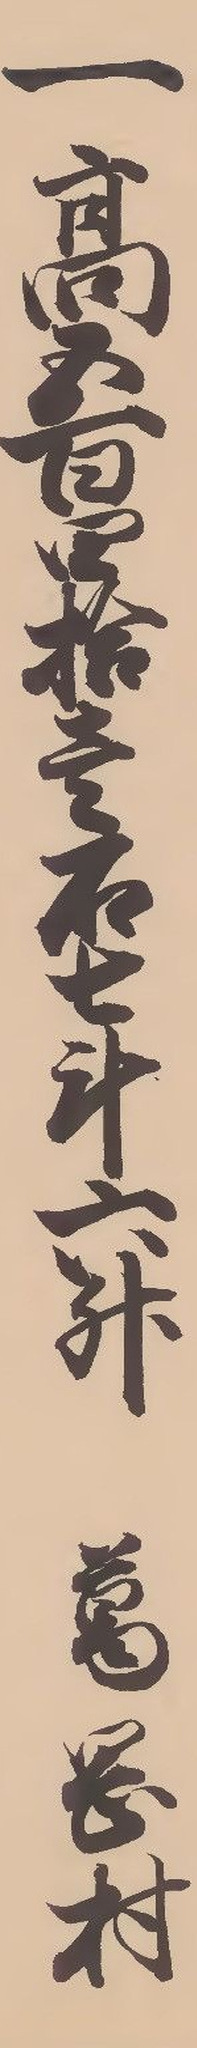一高五百四拾壱石七斗六升葛岡村
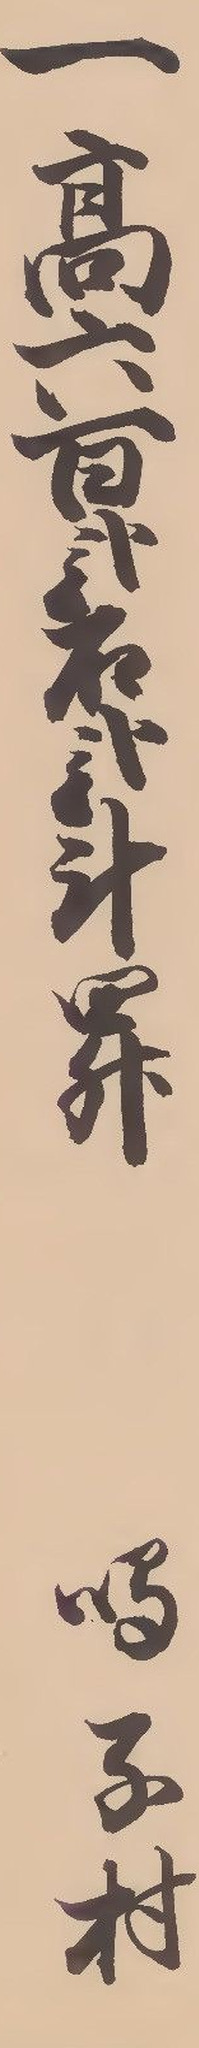一高六百弐石弐斗四升鳴子村

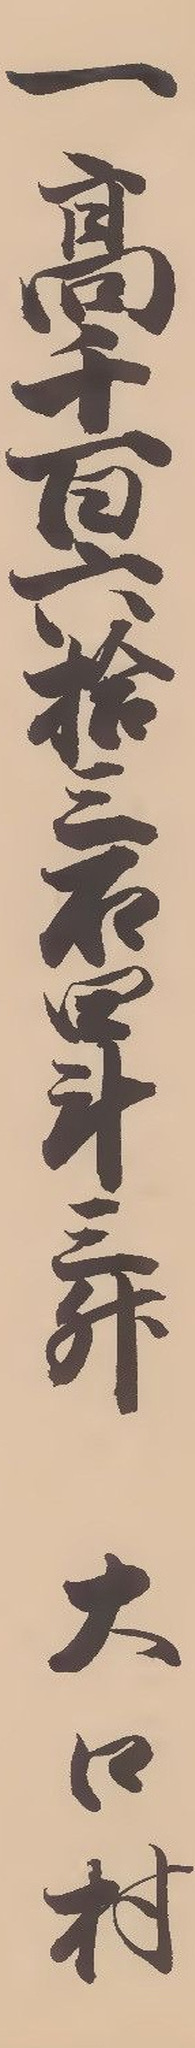一高千百六拾三石四斗三升大口村
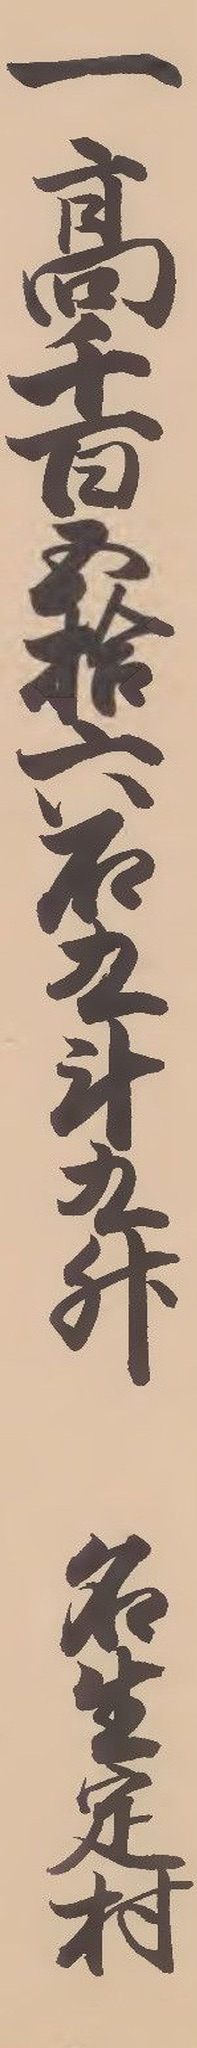一高千百五拾六石九斗九升名生定村
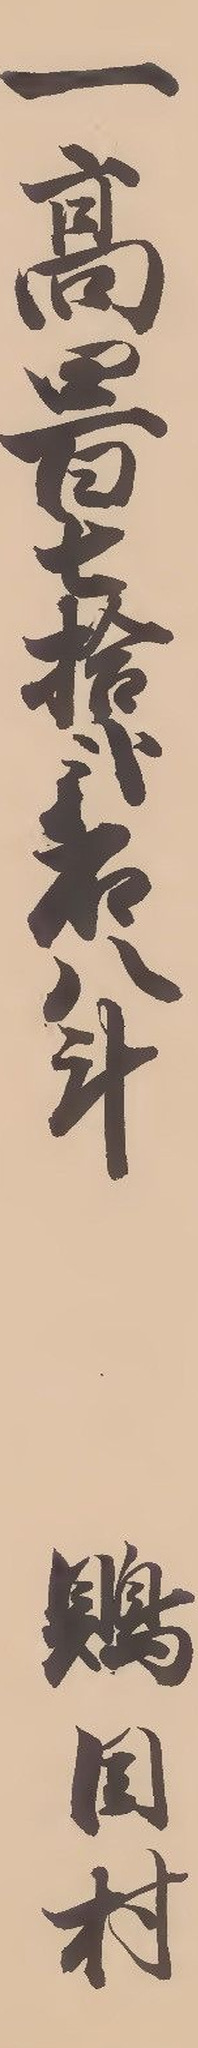一高四百七拾弐石八斗鵙目村
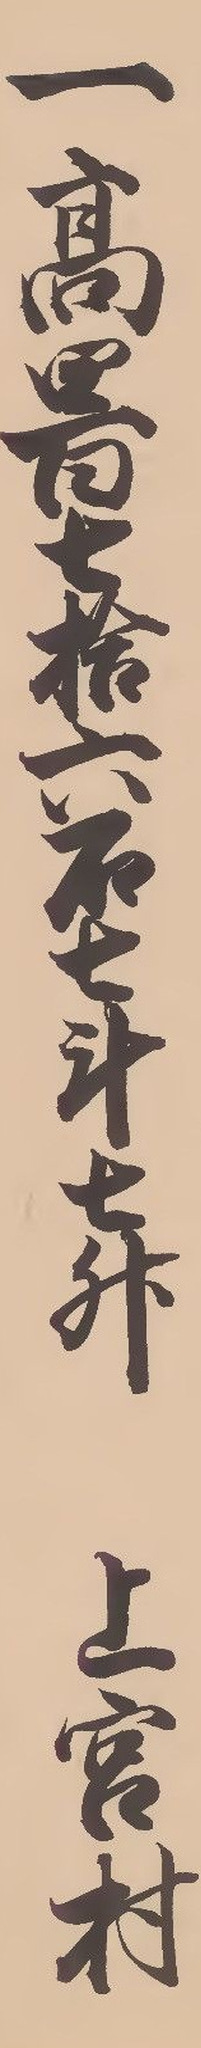一高四百七拾六石七斗七升上宮村
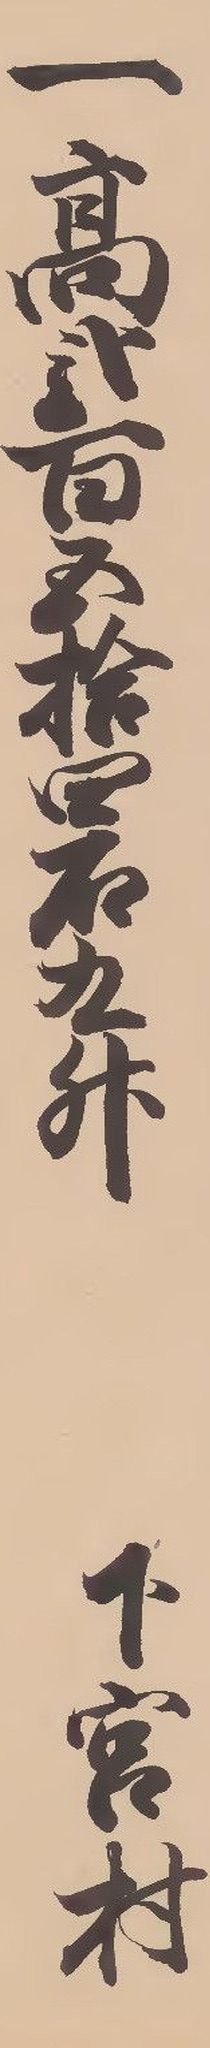一高弐百五拾四石九升下宮村
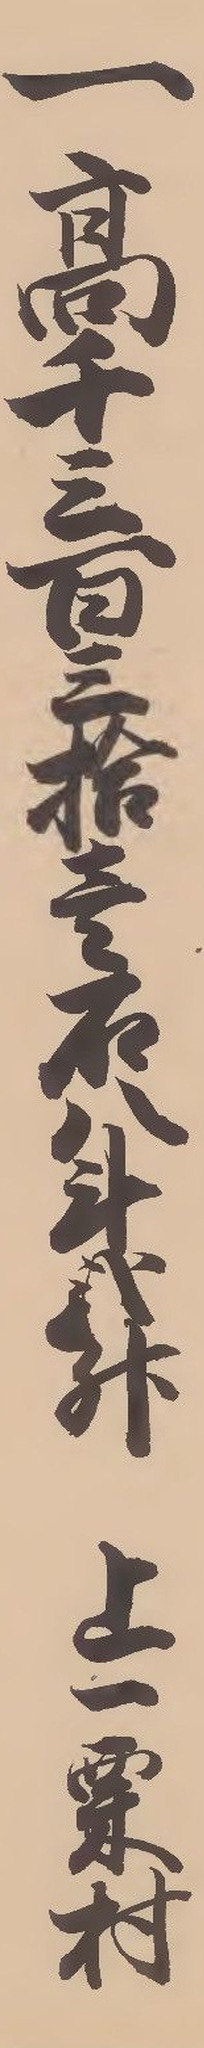一高千三百三拾壱石八斗弐升上一栗村
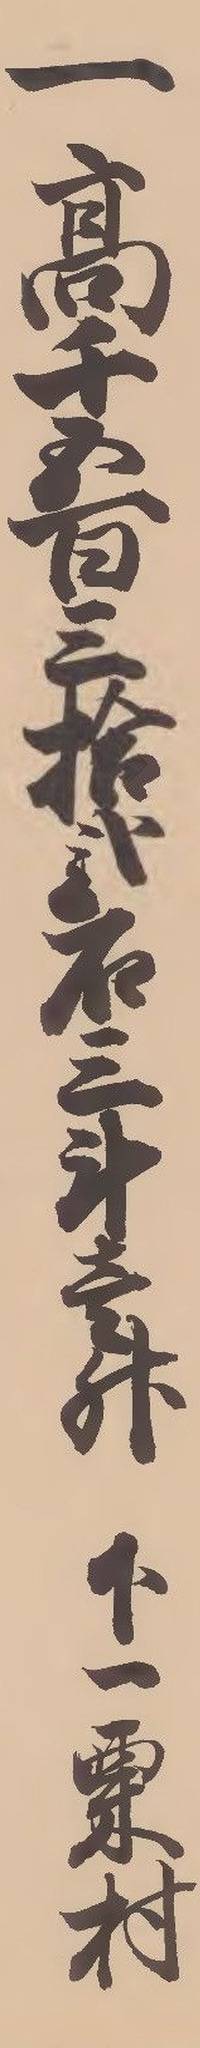一高千五百三拾弐石三斗壱升下一栗村
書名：陸奥国郷帳　５
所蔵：国立公文書館 National Archives of Japan
